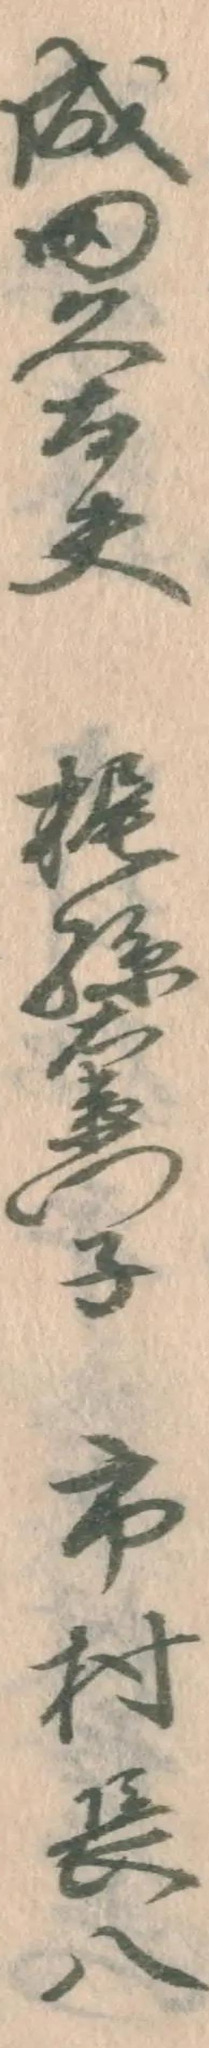成田久太夫梶孫右衛門子市村長八
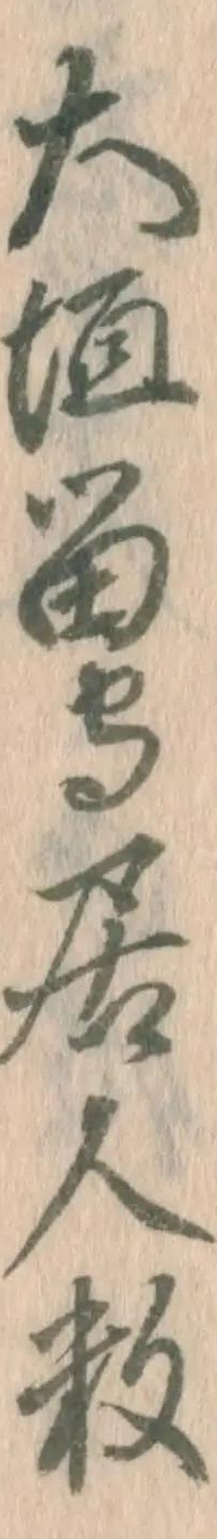大垣留守居人数
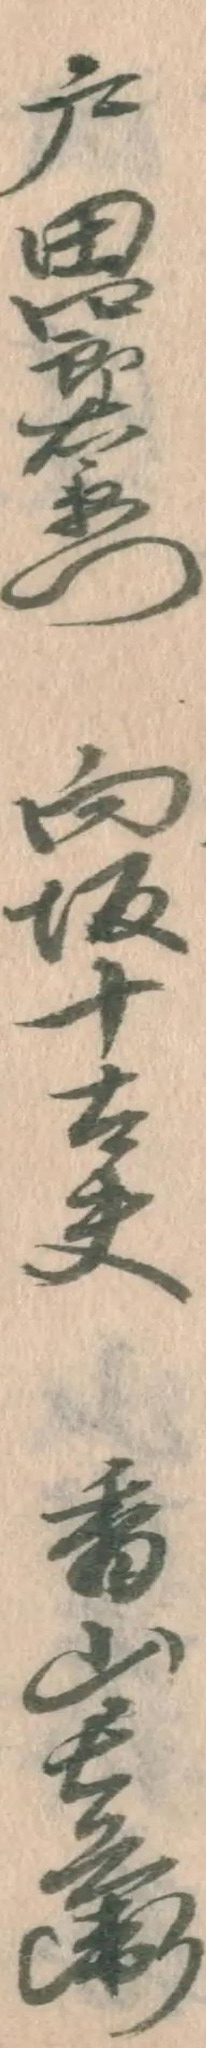戸田四郎右衛門向坂十太夫香山長兵衛
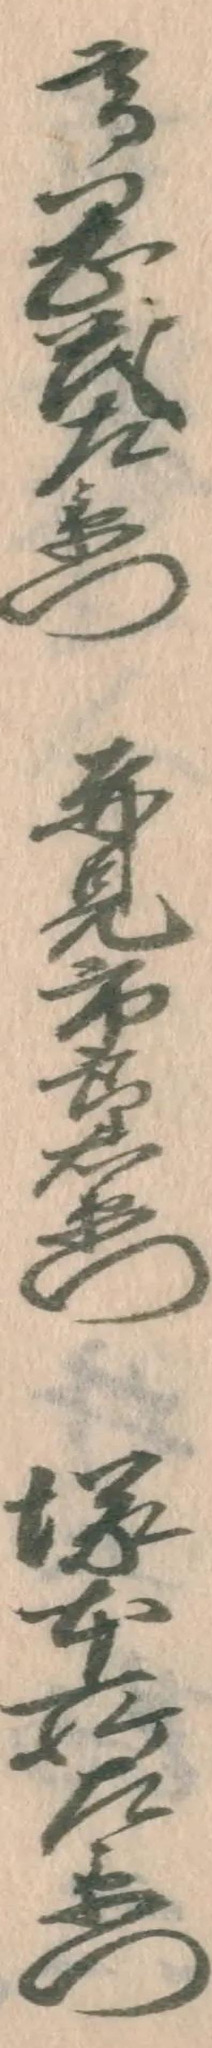高岡茂左衛門赤見市郎右衛門塚本所左衛門
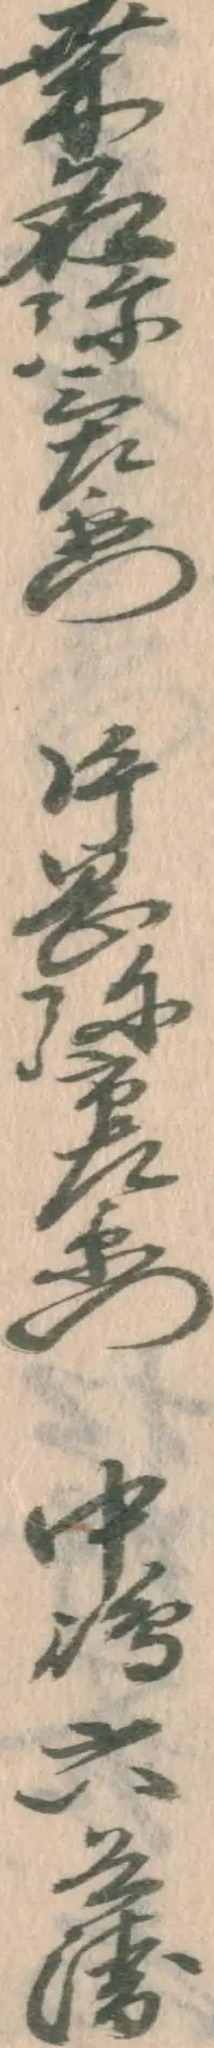桑名弥三左衛門片岡弥市左衛門中島六兵衛
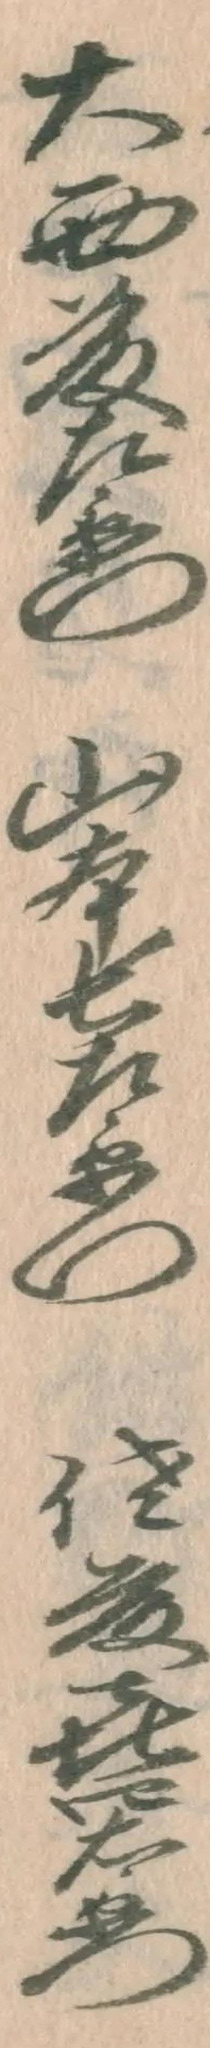大西藤左衛門山本長左衛門佐藤喜四右衛門
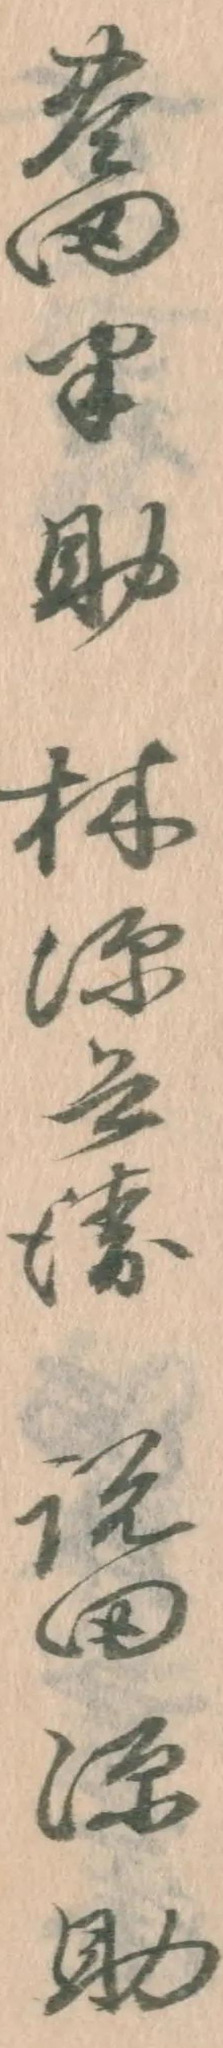豊田半助林源兵衛説田源助
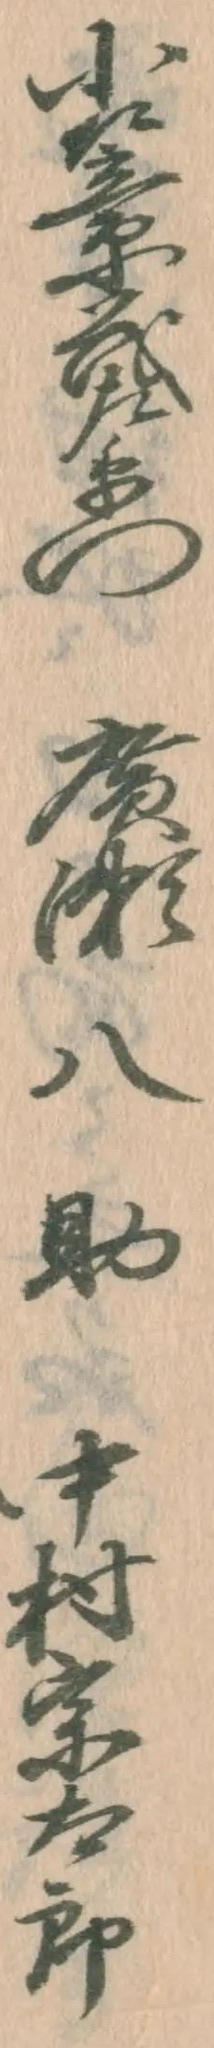小笠原茂左衛門広瀬八助中村宗太郎
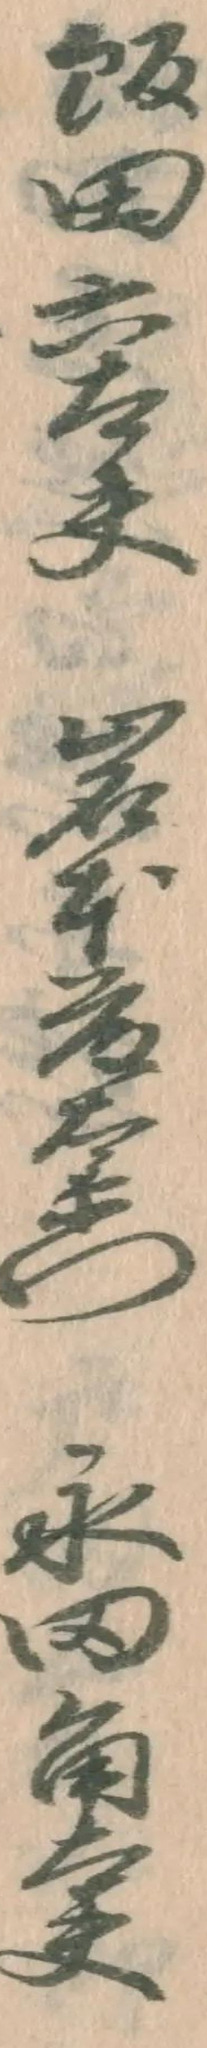飯田六太夫岸本藤右衛門永田角太夫
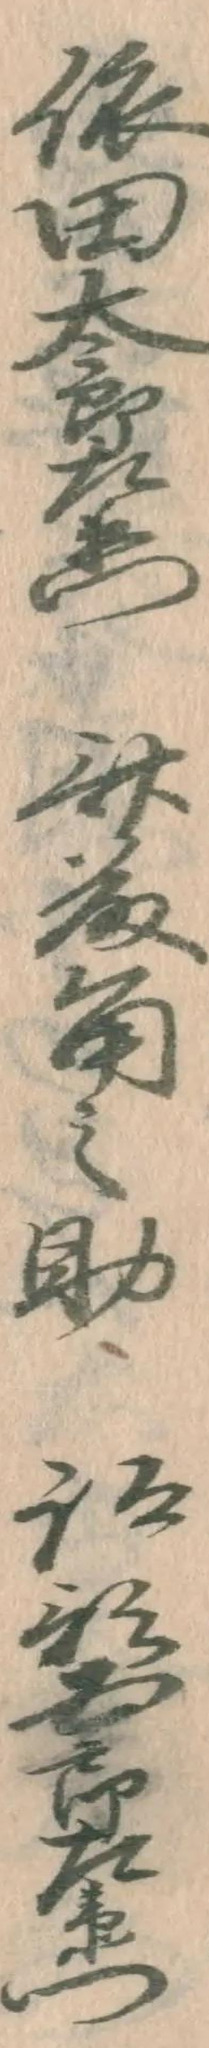依田太郎左衛門斎藤角之助跡部五郎左衛門
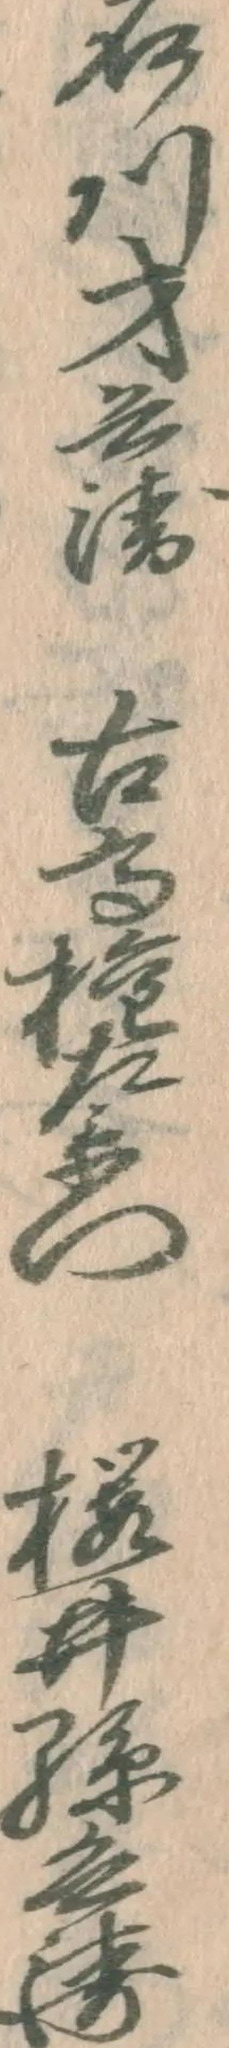石川才兵衛古高権左衛門桜井孫兵衛
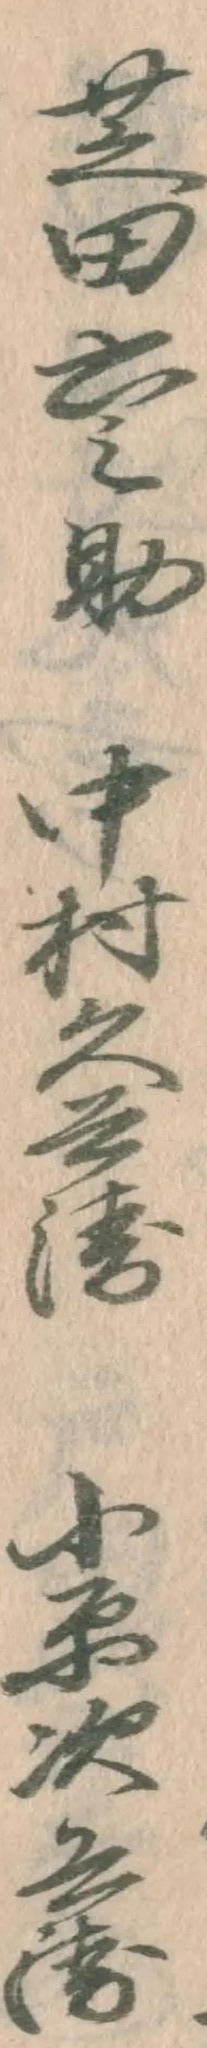芝田六之助中村久兵衛小原次兵衛
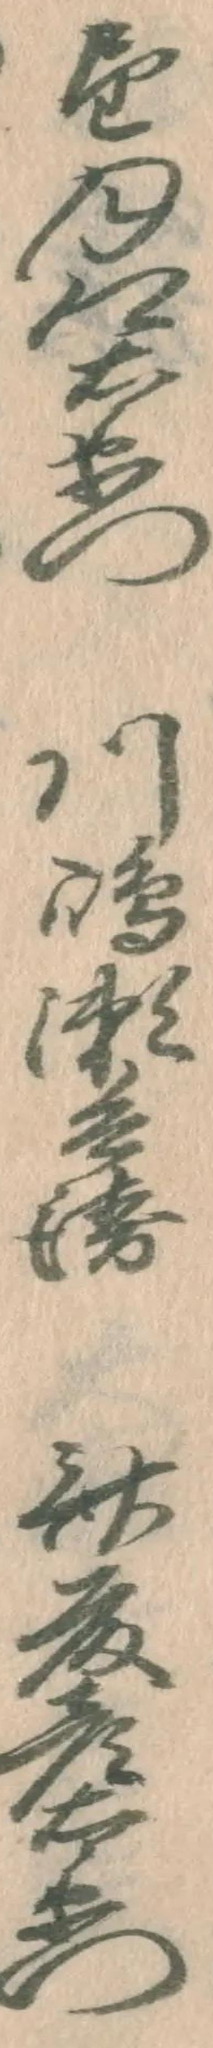望月郷右衛門川島瀬兵衛斎藤彦右衛門
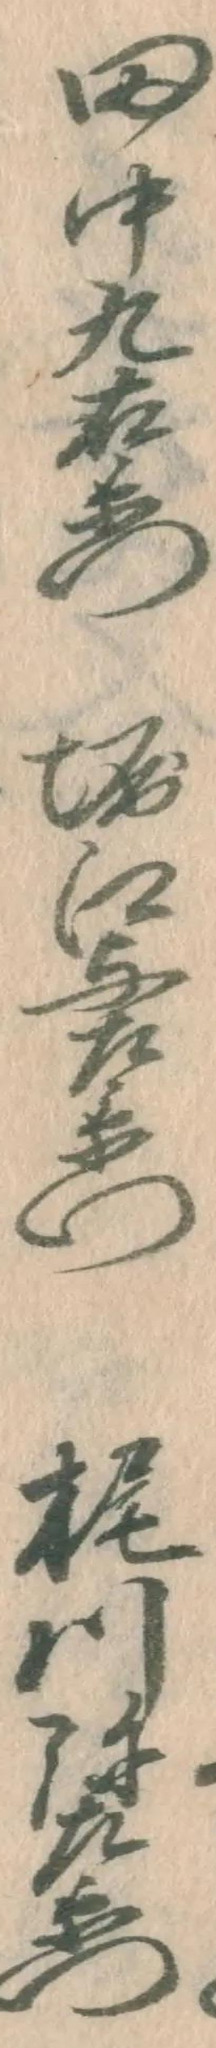田中久右衛門堀江与左衛門梶川弥左衛門
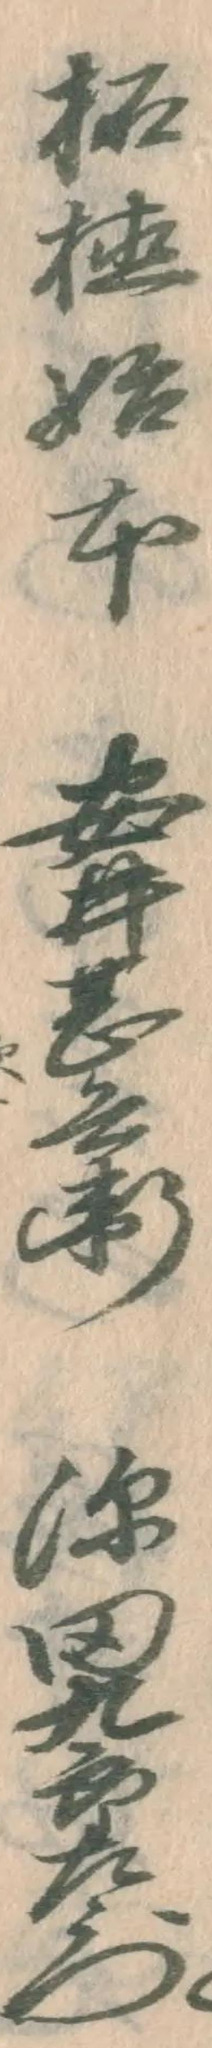柘植始本安井甚兵衛深田九郎左衛門
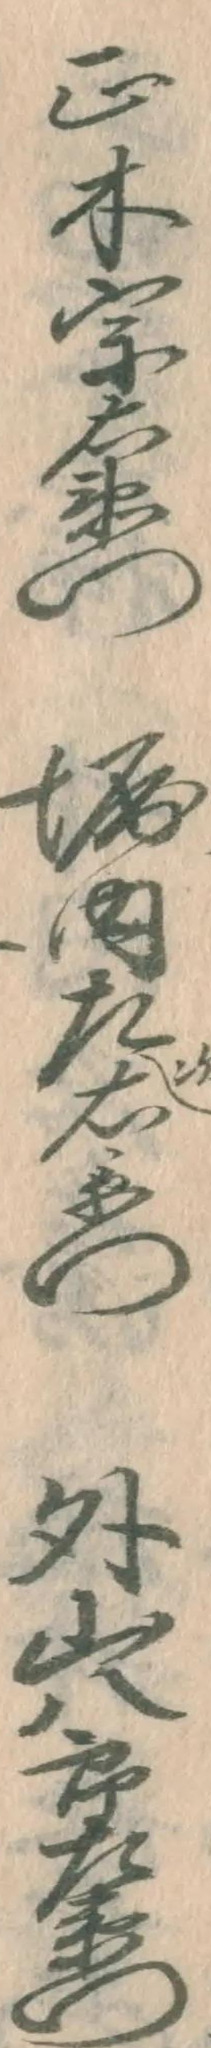正木宗右衛門堀内左次右衛門外山八郎左衛門
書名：切支丹御退治記 49巻. [4]
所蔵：国立国会図書館 National Diet Library, JAPAN
